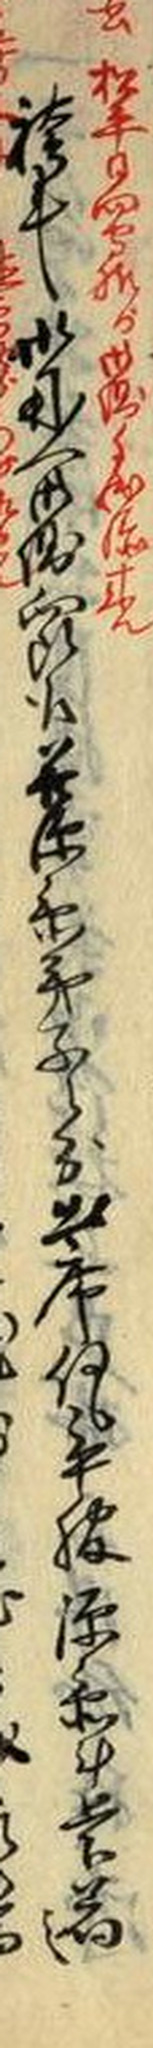袴斗御用人御側向頭取并源兵衛弟子分出席何も平服源兵衛斗上下着之
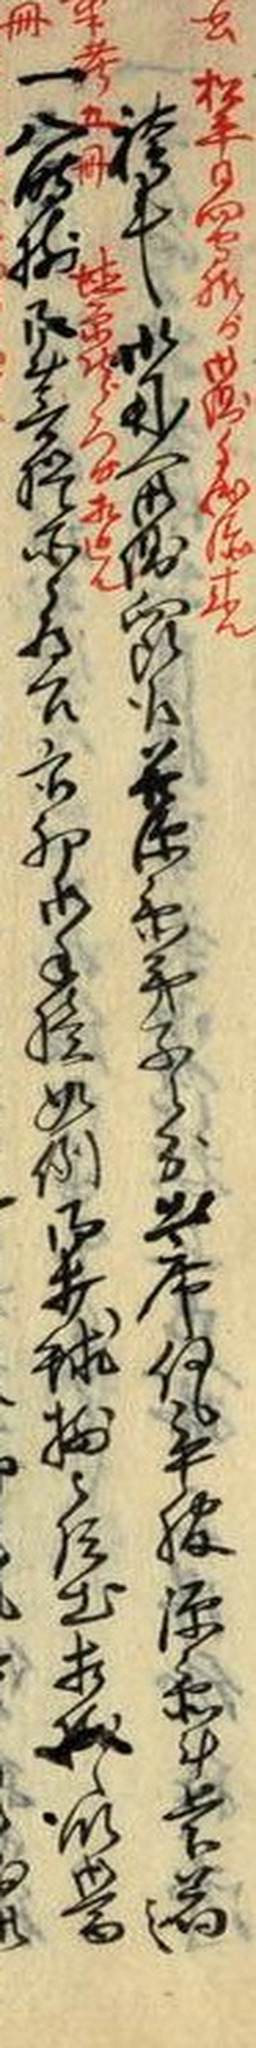一八時揃御菩提所被為召最初御手経如例御打毬揃被仰出相成候段御馬
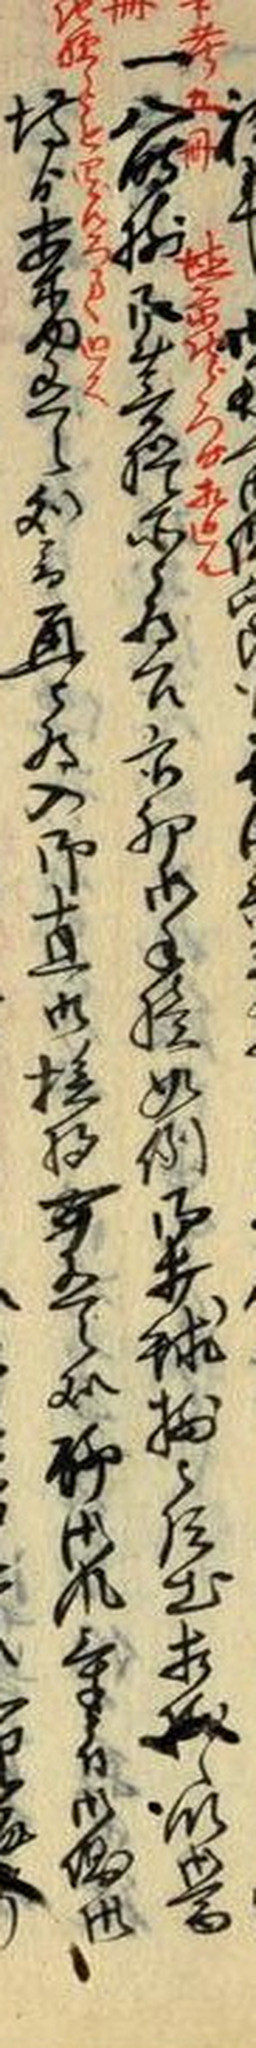場ゟ案内有之候処ニ而再被為入御直御挨拶可有候処聊御風気ニ付御側御
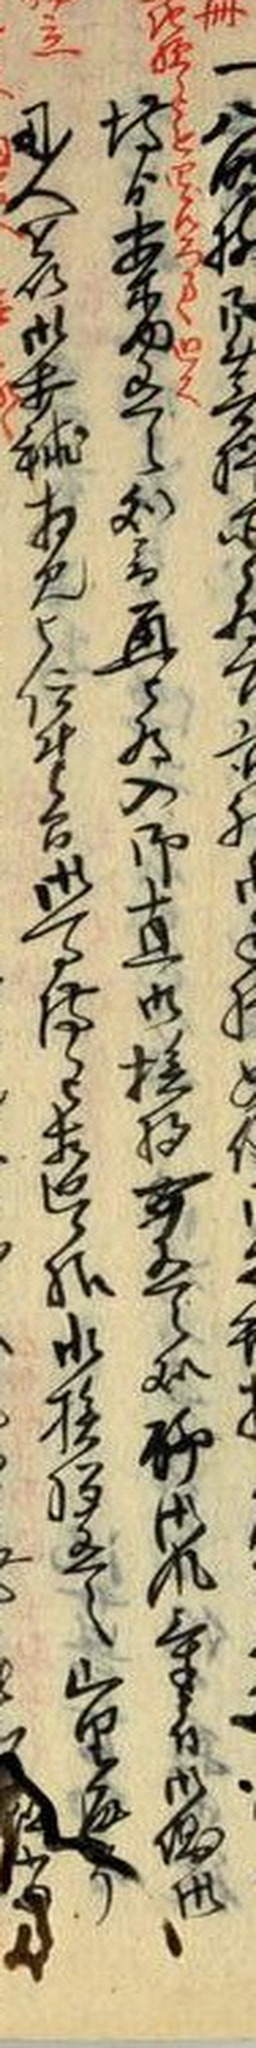用人を以御打毬拝見被仰付候間御馬場へ被相廻候様御挨拶有之山里通り
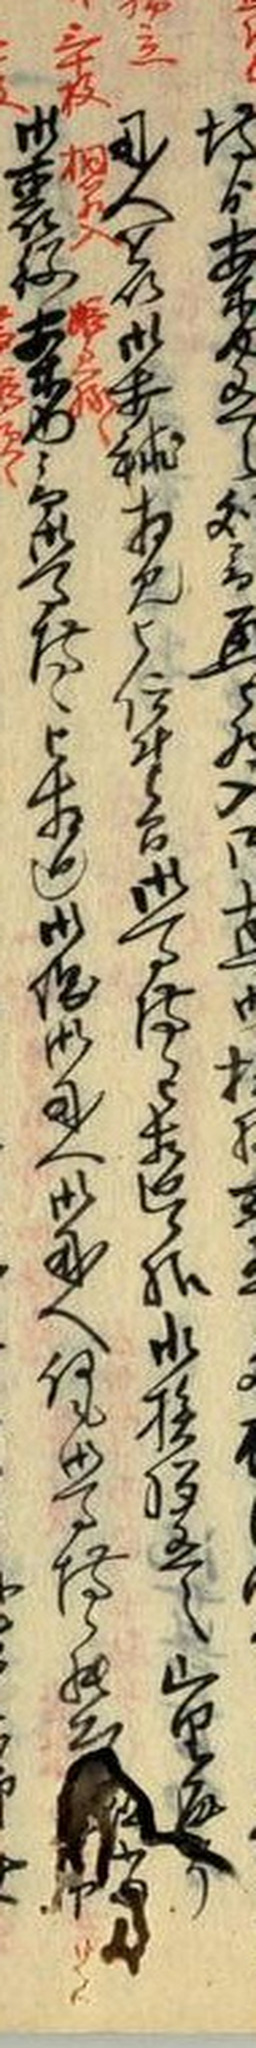御裏役案内ニ而御馬場へ被相通御側御用人御用人何も御馬場へ罷出
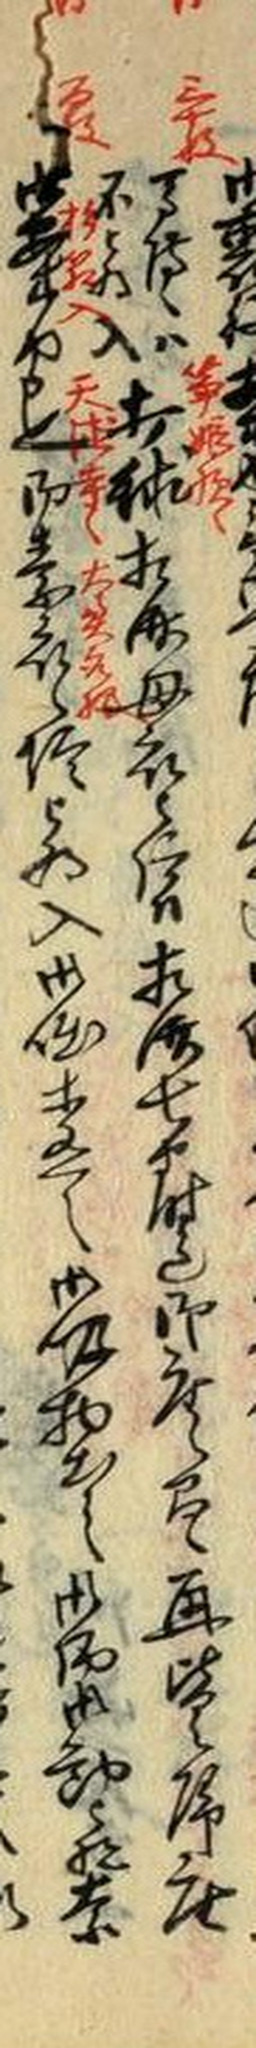御案内申上御素衣之儘被為入御咄等有之御吸物出之御酒御勧被遊奈
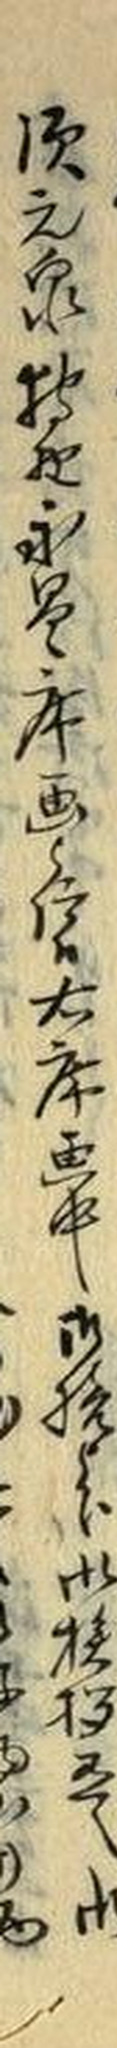須元泉狩野永昌へ席画被仰付右席画中御膳被下御挨拶有之御
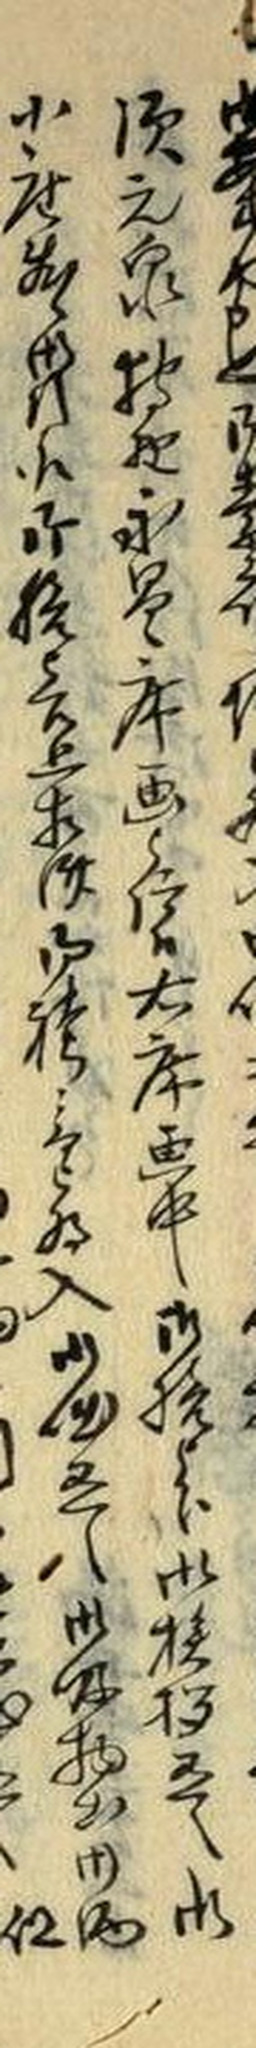小座敷へ御引取御膳被召上相済御袴ニ而被為入御咄有之御吸物出御酒
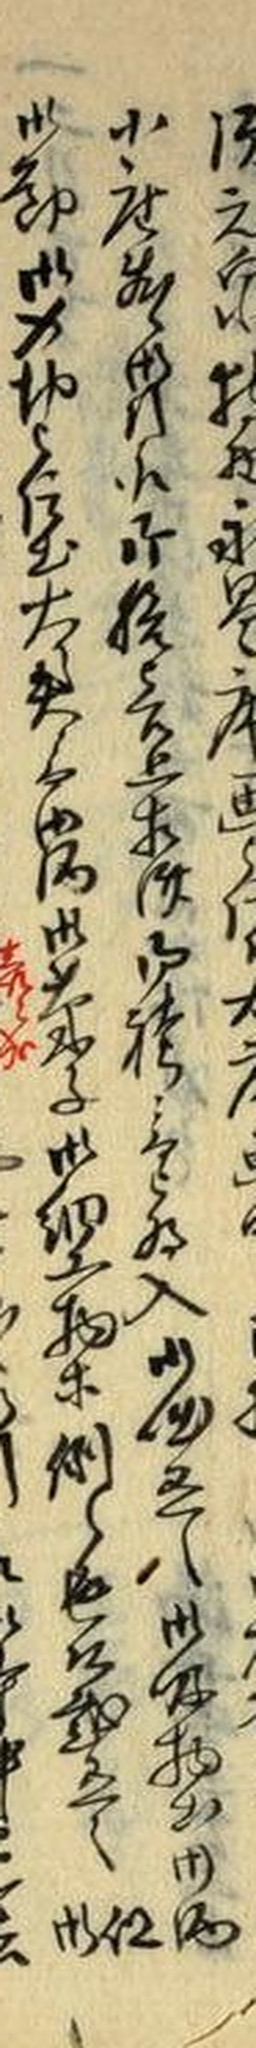御勧御〆切被仰出大奥ニ而御酒御菓子御細工物等例之通頂戴有之但御
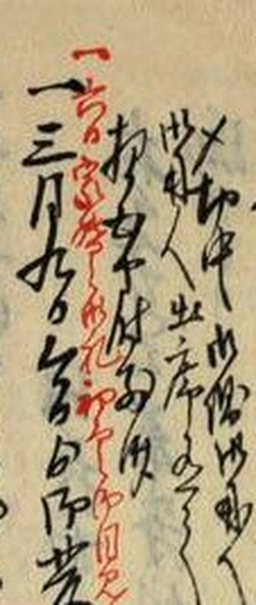夜五半時前済
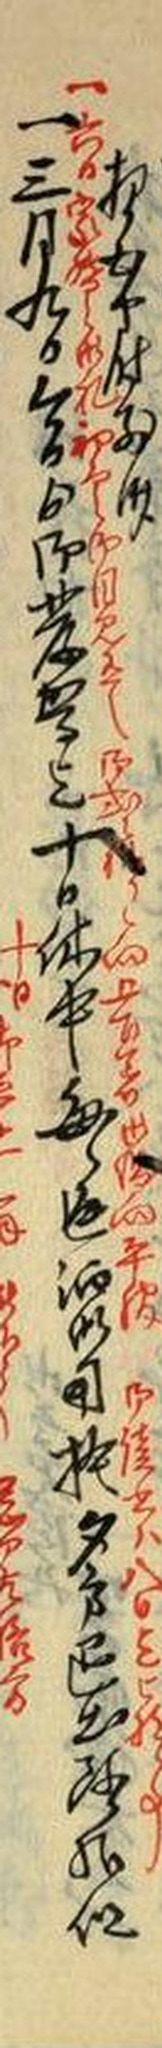一三月九日今日ゟ御発駕迄十日休中毎之通泊御用捨夕方退出致候様但
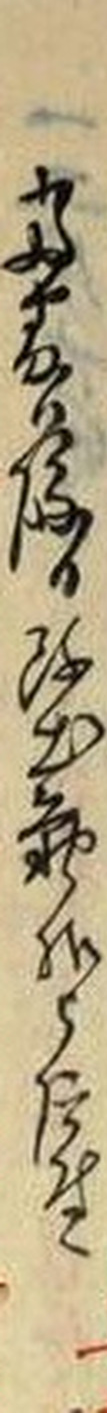奥番ハ隔日致出勤候様被仰付候
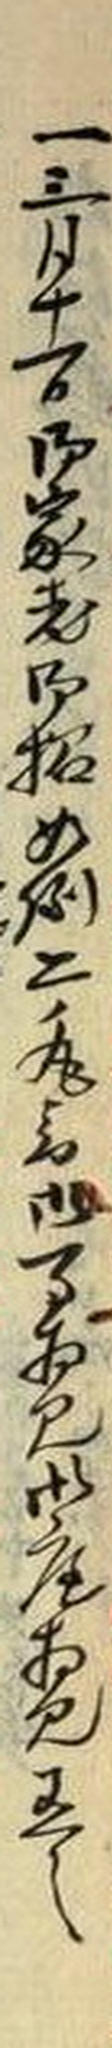一三月十一日御家老御招如例二ノ丸二而御馬拝見御庭拝見有之
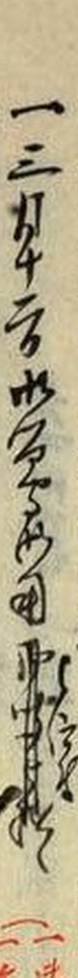一三月十二日御留守御用被仰付候
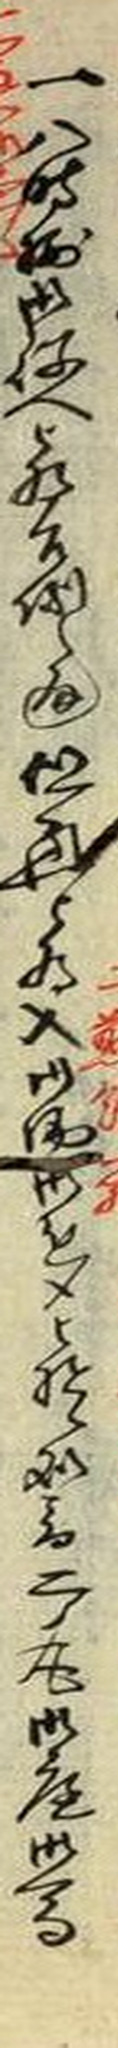一八時揃御役人被為召例之通但再被為入御酒被進メ被遊候処ニ而二ノ丸御庭御馬
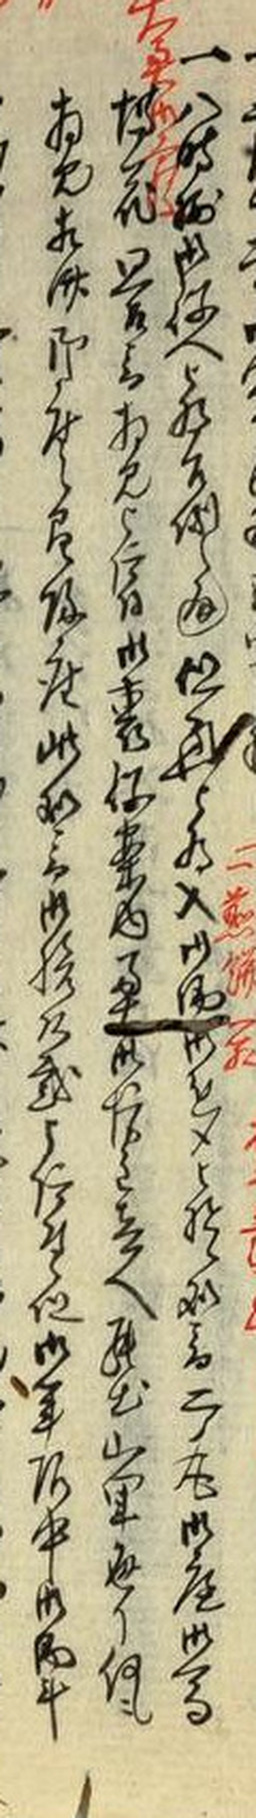場花思召ニ而拝見被仰付御裏役案内奥御坊主壱人罷出山里通り何も
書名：少傅日録抄（斉承付側向頭取日記、在国）
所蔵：福井県文書館 Fukui Prefectural Archives
